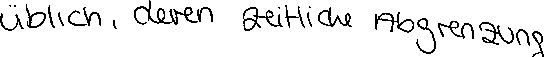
üblich, deren zeitliche Abgrenzung
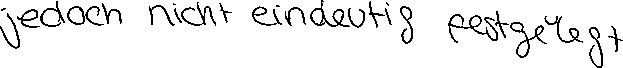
jedoch nicht eindeutig festgelegt
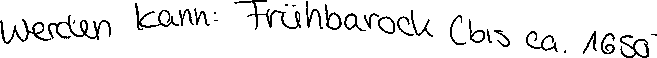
werden kann: Frühbarock (bis ca. 1650
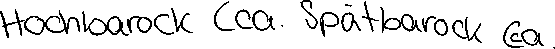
Hochbarock (ca. Spätbarock (ca.
